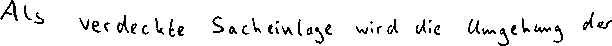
Als verdeckte Sacheinlage wird die Umgehung der
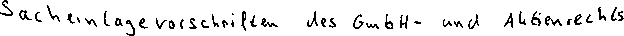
Sacheinlagevorschriften des GmbH- und Aktienrechts
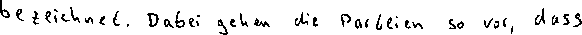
bezeichnet. Dabei gehen die Parteien so vor, dass
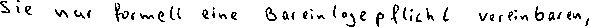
sie nur formell eine Bareinlagepflicht vereinbaren,
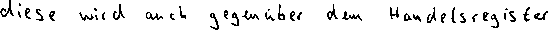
diese wird auch gegenüber dem Handelsregister
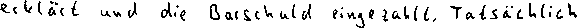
erklärt und die Barschuld eingezahlt. Tatsächlich
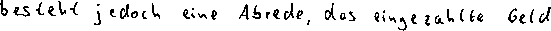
besteht jedoch eine Abrede, das eingezahlte Geld
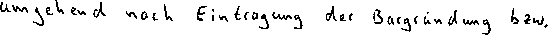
umgehend nach Eintragung der Bargründung bzw.
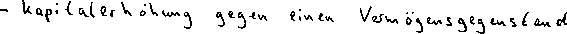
- kapitalerhöhung gegen einen Vermögensgegenstand
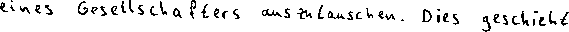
eines Gesellschafters auszutauschen. Dies geschieht
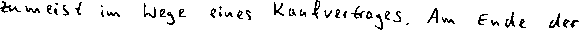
zumeist im Wege eines Kaufvertrages. Am Ende der
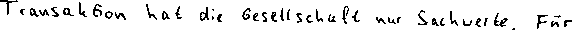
Transaktion hat die Gesellschaft nur Sachwerte. Für
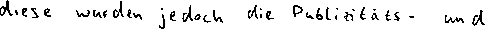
diese wurden jedoch die Publizitäts- und
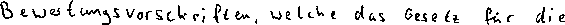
Bewertungsvorschriften, welche das Gesetz für die
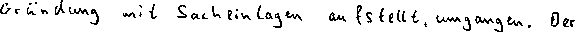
Gründung mit Sacheinlagen aufstellt, umgangen. Der
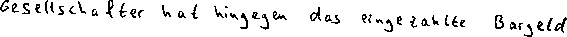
Gesellschafter hat hingegen das eingezahlte Bargeld
